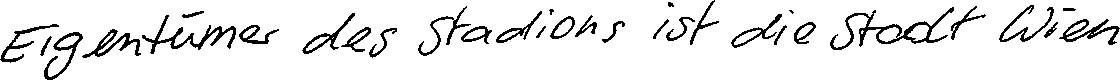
Eigentümer des Stadions ist die Stadt Wien
